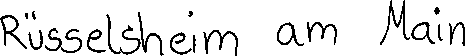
Rüsselsheim am Main
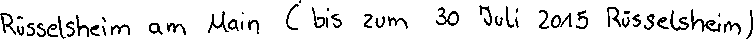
Rüsselsheim am Main (bis zum 30. Juli 2015 Rüsselsheim)
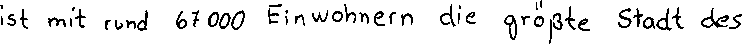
ist mit rund 67.000 Einwohnern die größte Stadt des
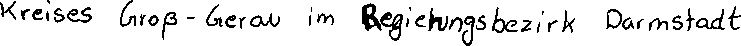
Kreises Groß-Gerau im Regierungsbezirk Darmstadt
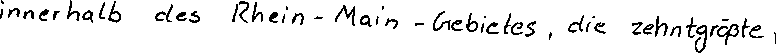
innerhalb des Rhein-Main-Gebietes, die zehntgrößte
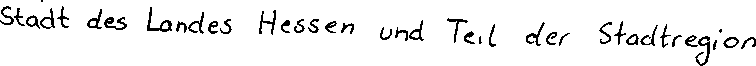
Stadt des Landes Hessen und Teil der Stadtregion
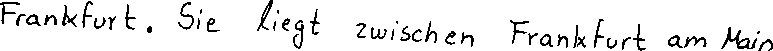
Frankfurt. Sie liegt zwischen Frankfurt am Main
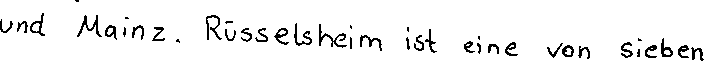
und Mainz. Rüsselsheim ist eine von sieben
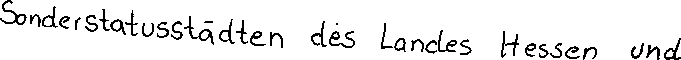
Sonderstatusstädten des Landes Hessen und
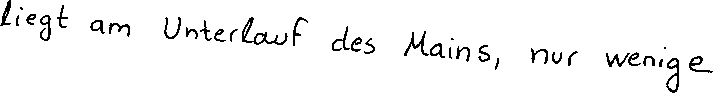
liegt am Unterlauf des Mains, nur wenige
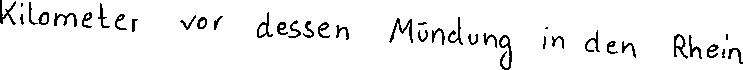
Kilometer vor dessen Mündung in den Rhein
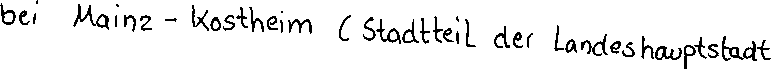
bei Mainz-Kostheim (Stadtteil der Landeshauptstadt
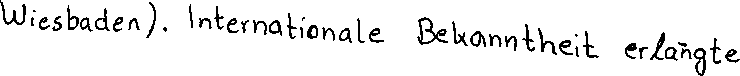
Wiesbaden). Internationale Bekanntheit erlangte
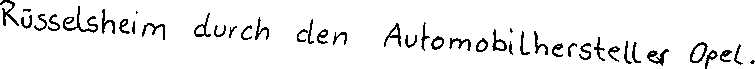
Rüsselsheim durch den Automobilhersteller Opel.
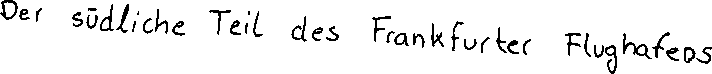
Der südliche Teil des Frankfurter Flughafens
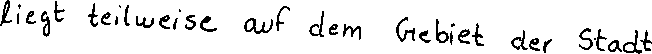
liegt teilweise auf dem Gebiet der Stadt
